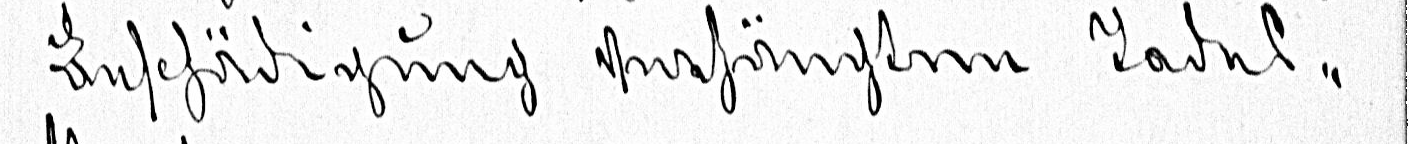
Beschädigung verhängten Todes¬
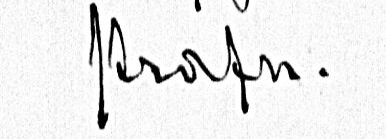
strafe.
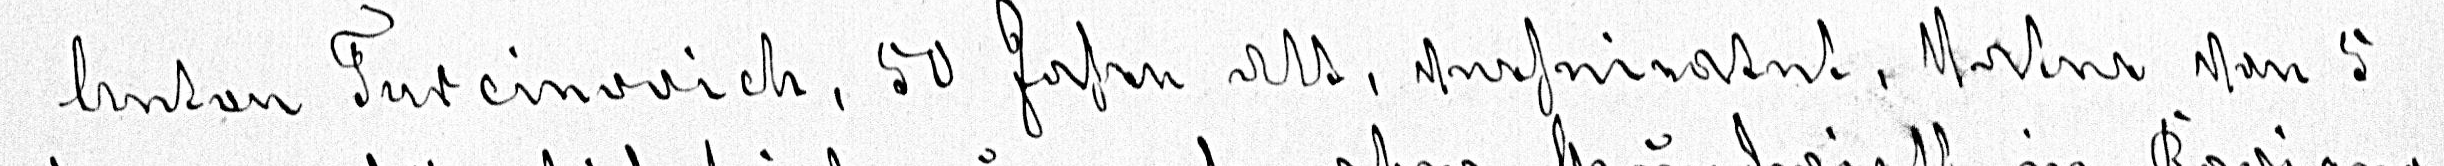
Anton Turcinovich, 50 Jahre alt, verheiratet, Vater von 5
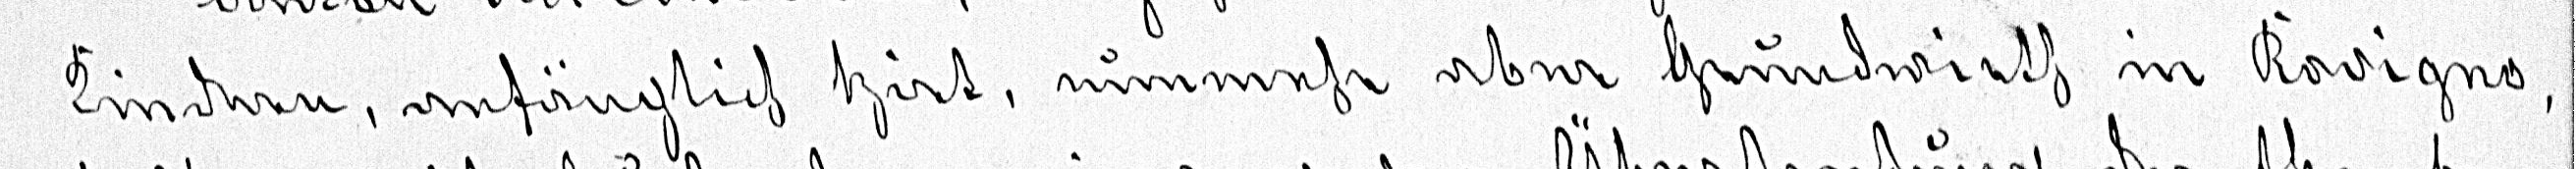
Kindern, anfänglich Hirt, nunmehr aber Grundwirth in Rovigno,
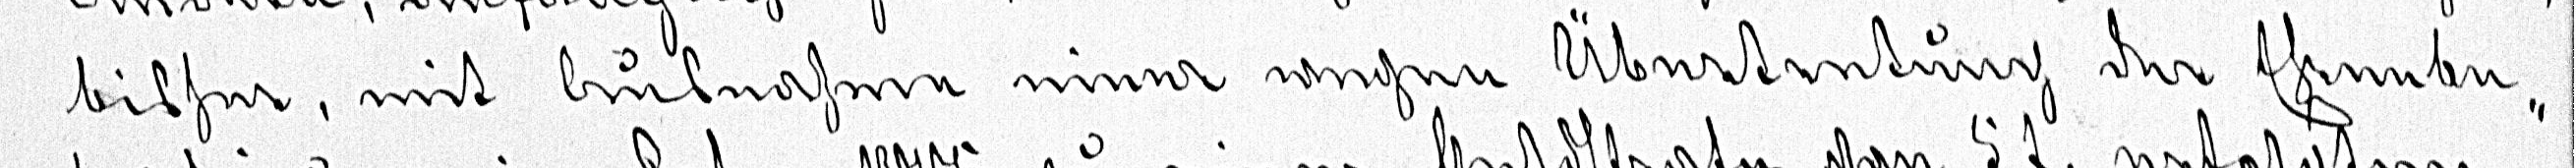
bisher, mit Ausnahme einer wegen Übertretung der Ehrenbe¬
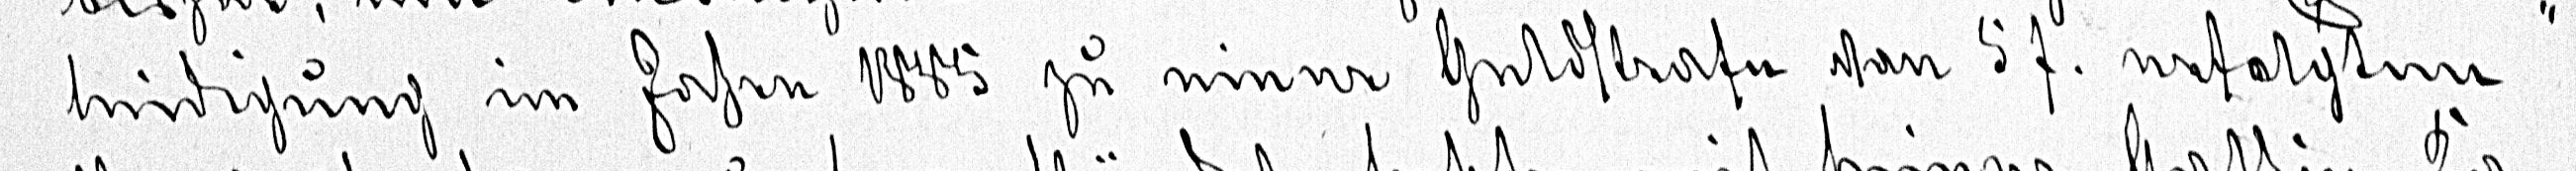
leidigung im Jahre 1885 zu einer Geldstrafe von 5f. erfolgten
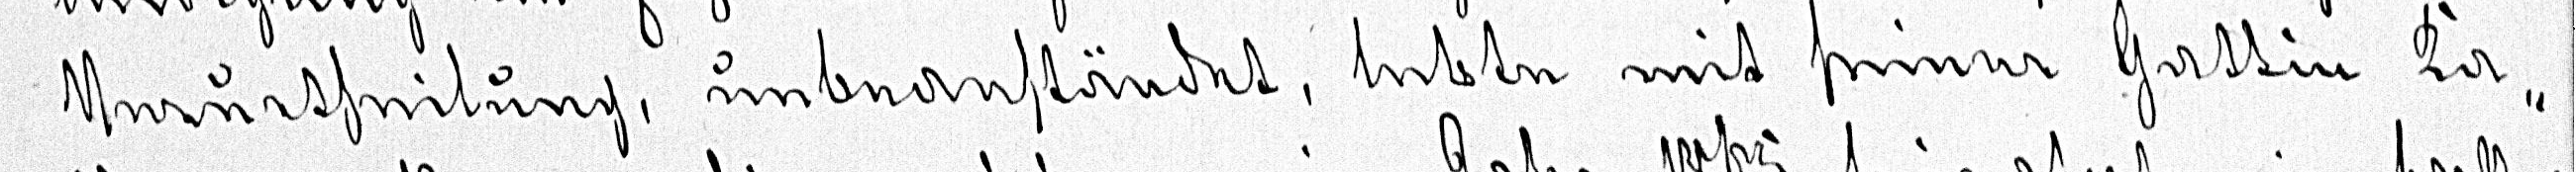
Verurtheilung, unbeanständet, lebte mit seiner Gattin Ka¬
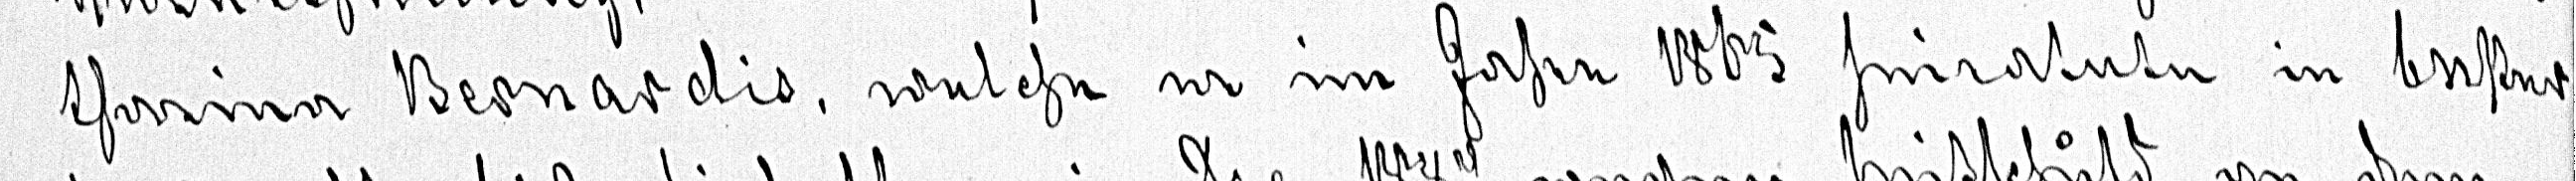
tharina Bernardis, welche er im Jahre 1865 heiratete in bester
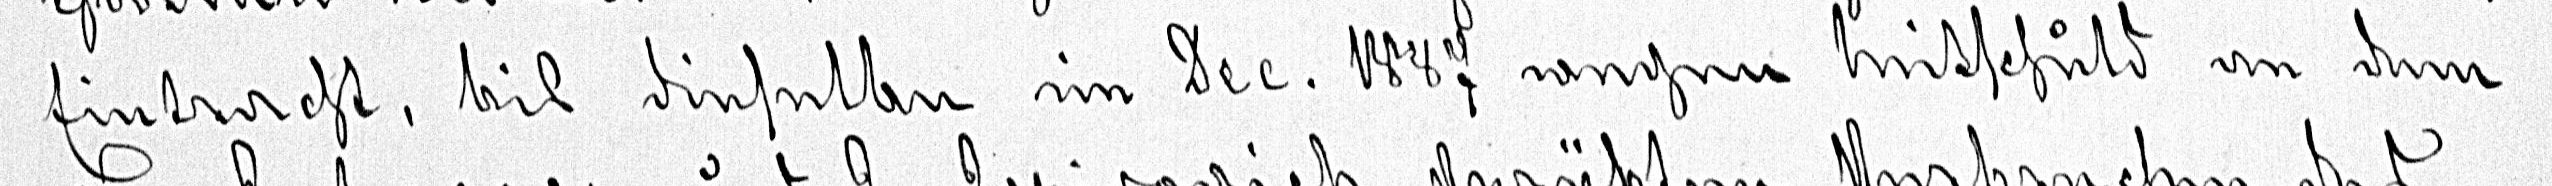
Eintracht, bis dieselbe im Dec. 1887 wegen Mitschuld an dem
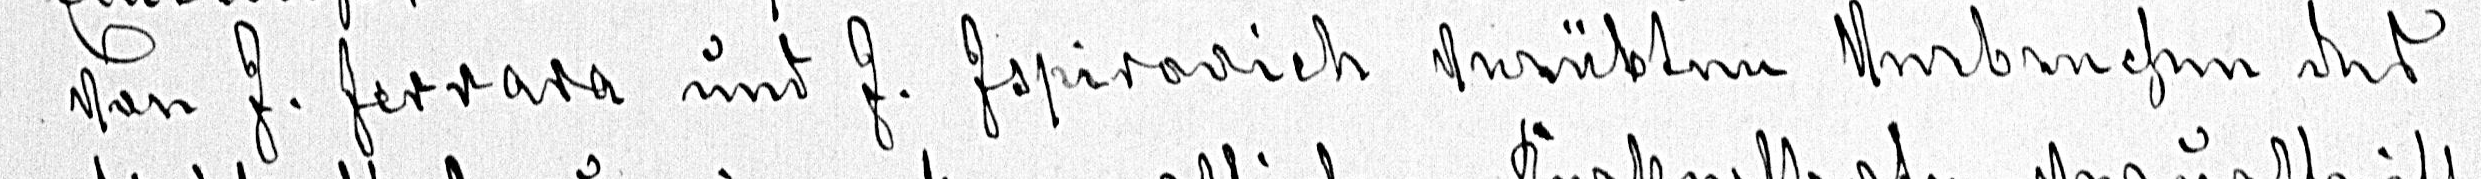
von J. Ferrara und J. Ispirovich verübten Verbrechen des
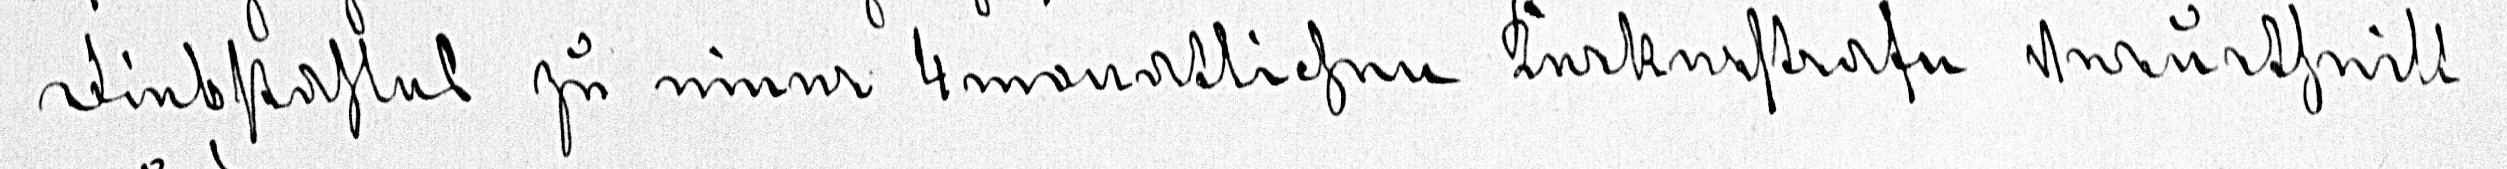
Diebstahles zu einer 4 monatlichen Kerkerstrafe verurtheilt
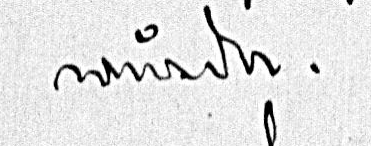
wurde.
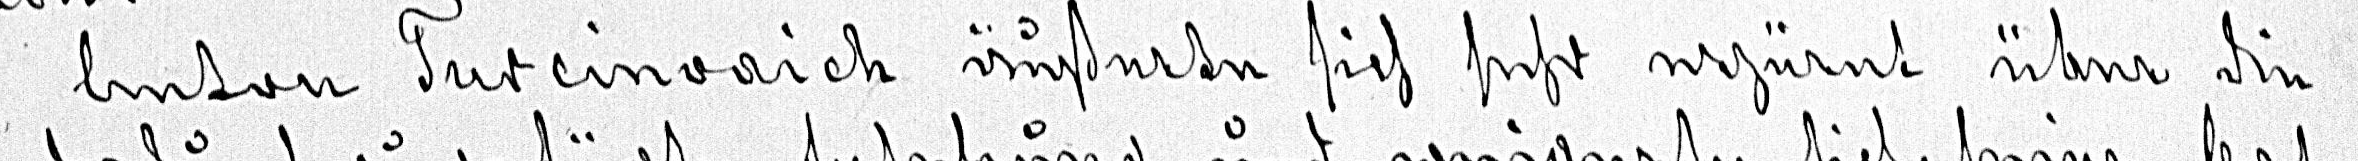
Anton Turcinovich äußerte sich sehr erzürnt über die
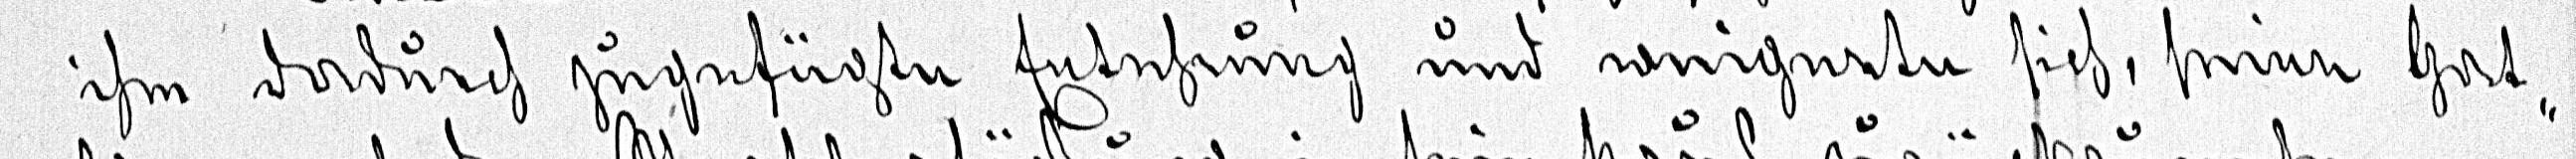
ihm dadurch zugefügte Entehrung und weigerte sich, seine Gat¬
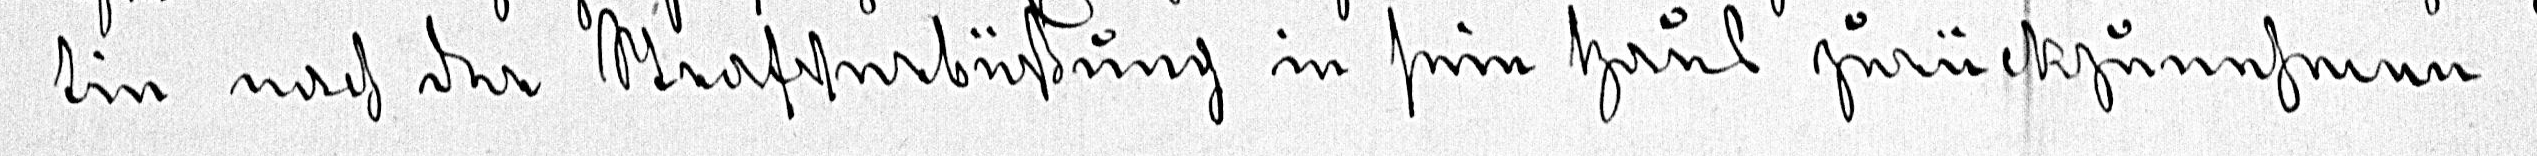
tin nach der Strafverbüßung in sein Haus zurückzunehmen
